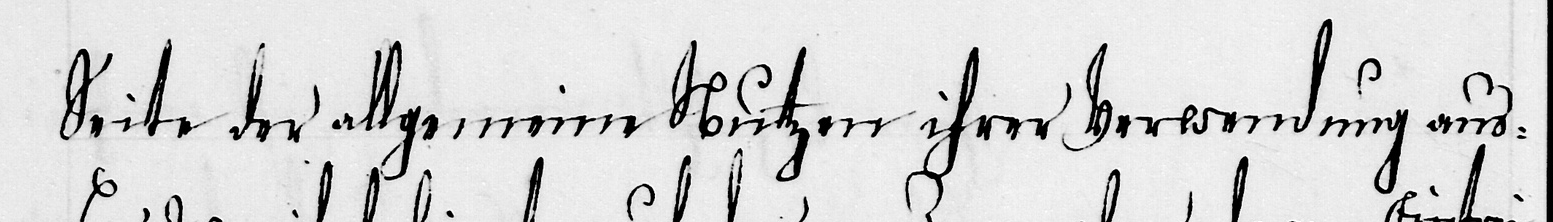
Seite der allgemeine Nutzen ihrer Verwendung auß¬
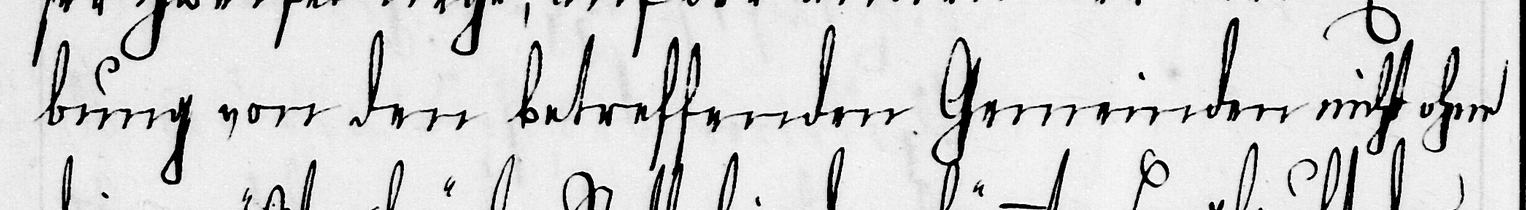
bung von den betreffenden Gemeinden nicht ohne
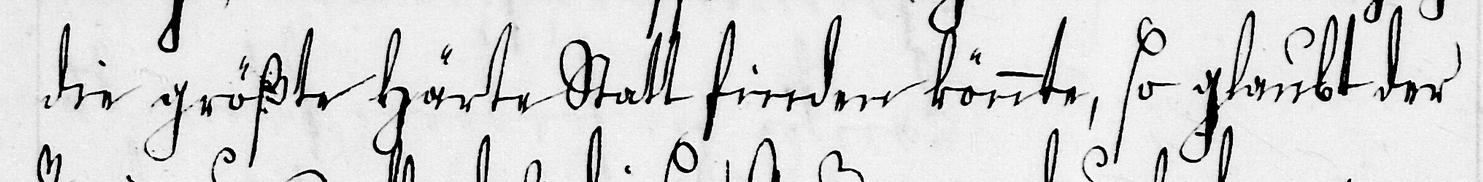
die größte Härte Statt finden könnte, so glaubt der
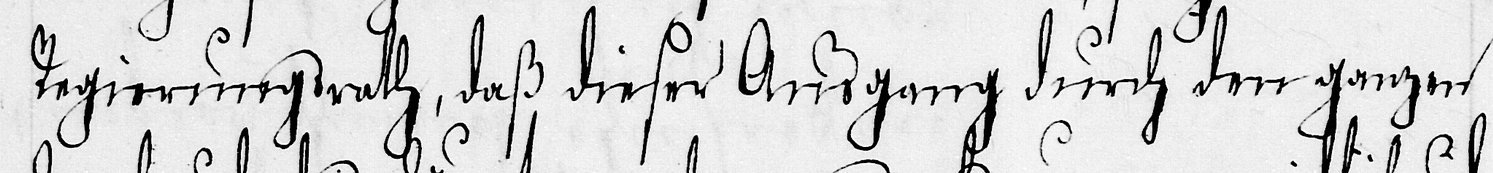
Regierungsrath, daß dieser Ausgang durch den ganzen
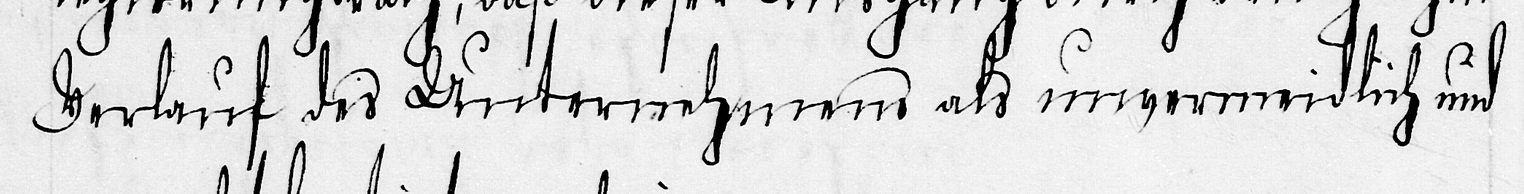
Verlauf des Unternehmens als unvermeidlich und
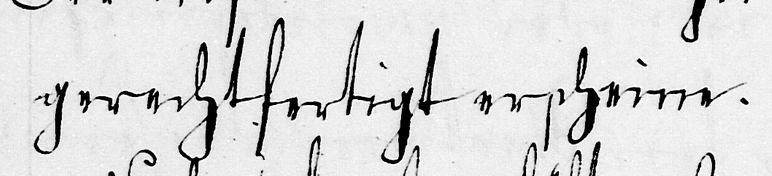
gerechtfertigt erscheine.
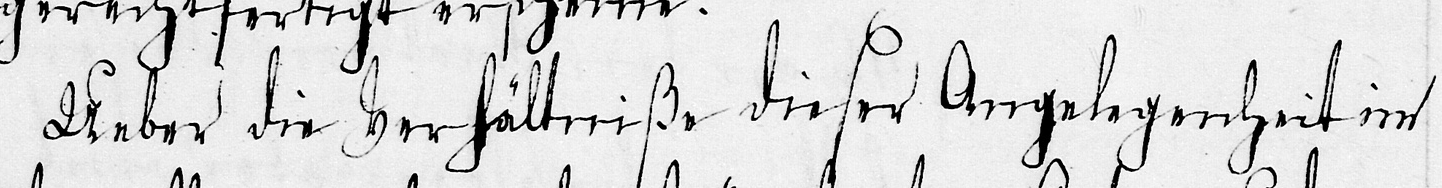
Ueber die Verhältniße dieser Angelegenheit im
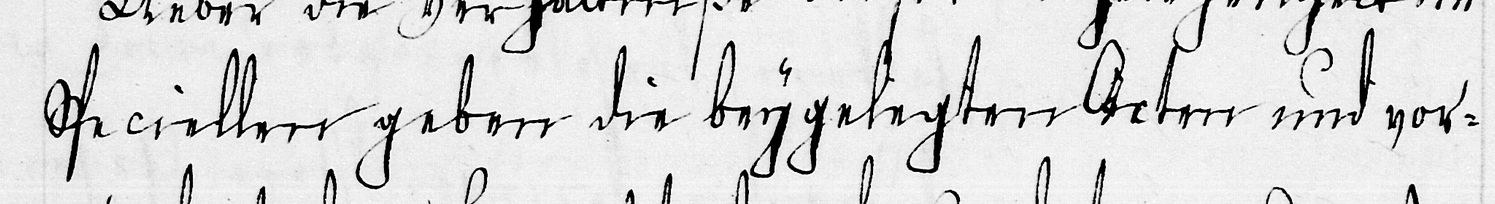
Speciellen geben die beygelegten Acten und vor¬
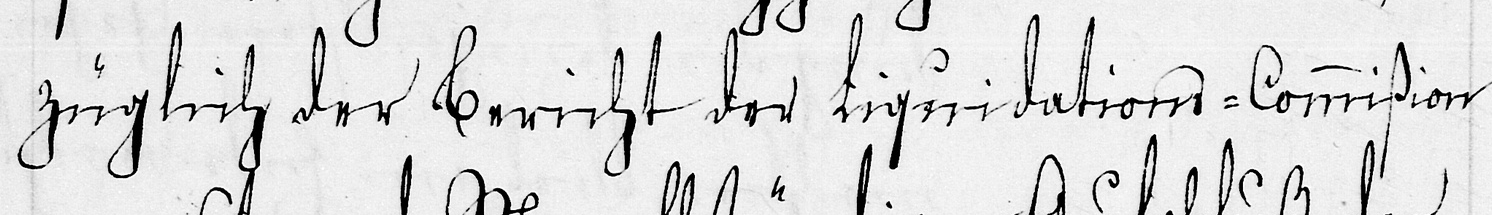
züglich der Bericht der Liquidations-Commißion
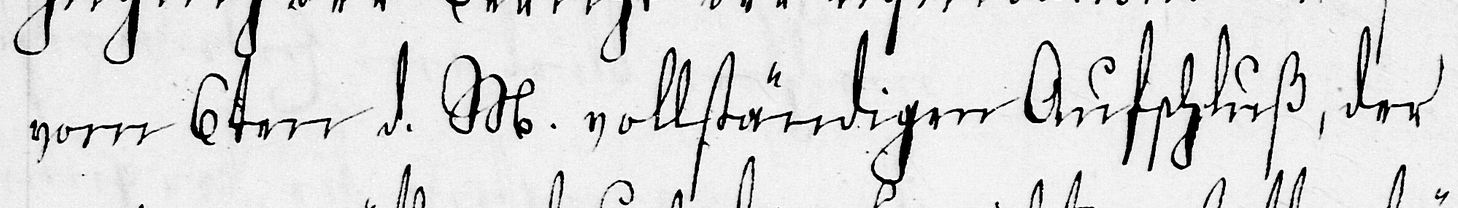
vom 6ten d. M. vollständigen Aufschluß, der
